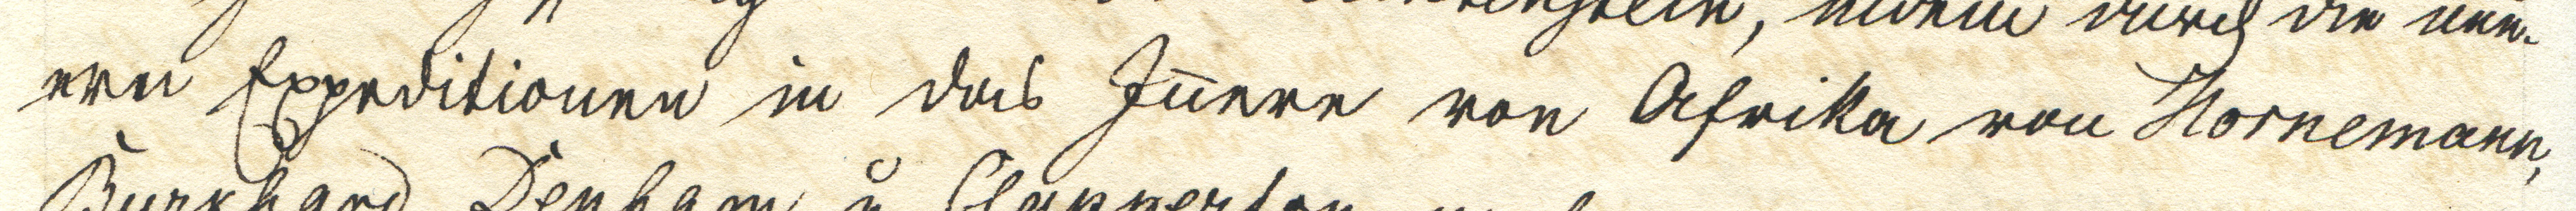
ern Expeditionen in das Iñere von Afrika von Hornemann,
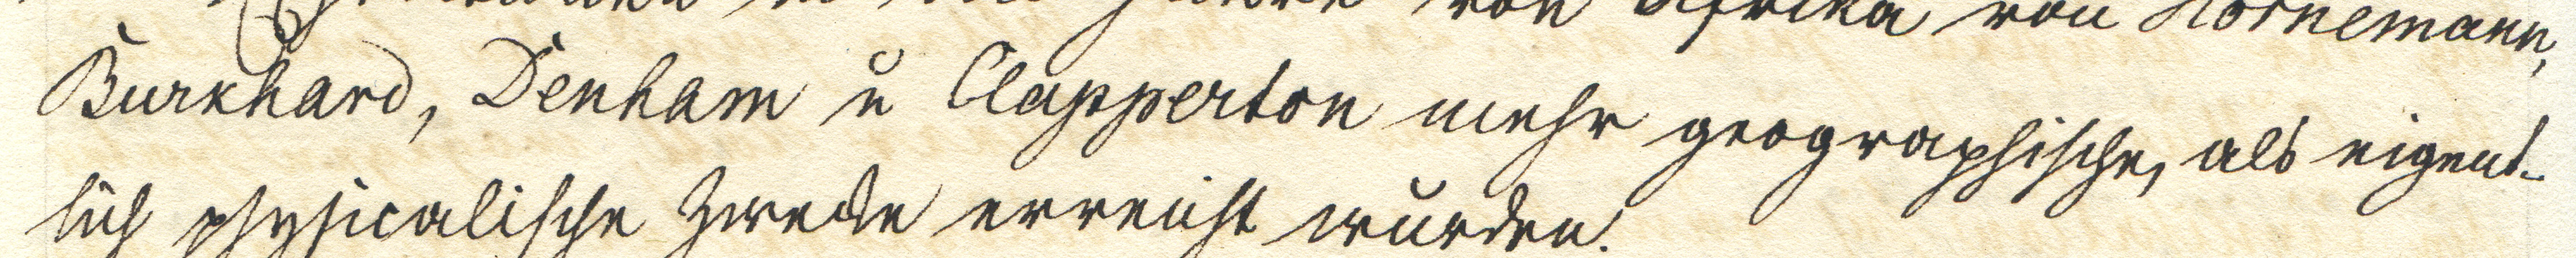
Burkhard, Denham u Clapperton mehr geographische, als eigent-
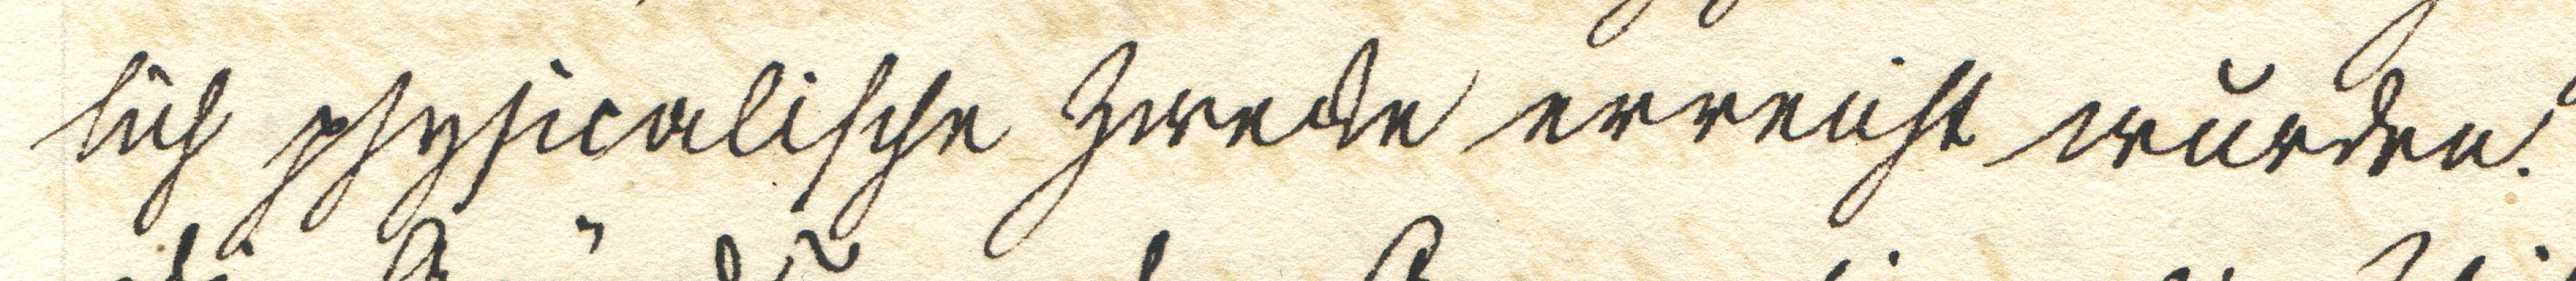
lich physicalische Zwecke erreicht wurden.
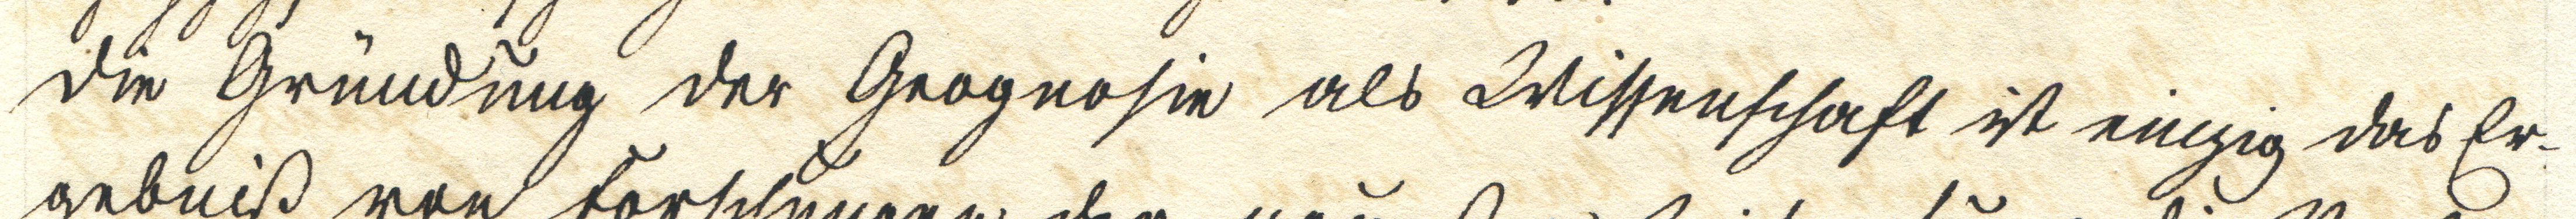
Die Gründung der Geognosie als Wissenschaft ist einzig das Er-
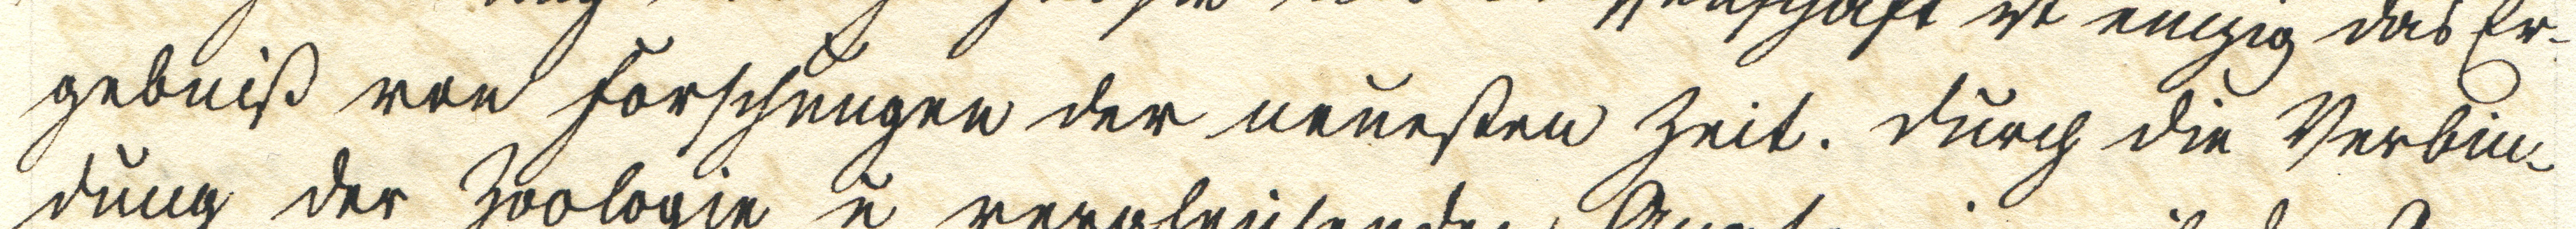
gebniß von Forschungen der neuesten Zeit. Durch die Verbin-
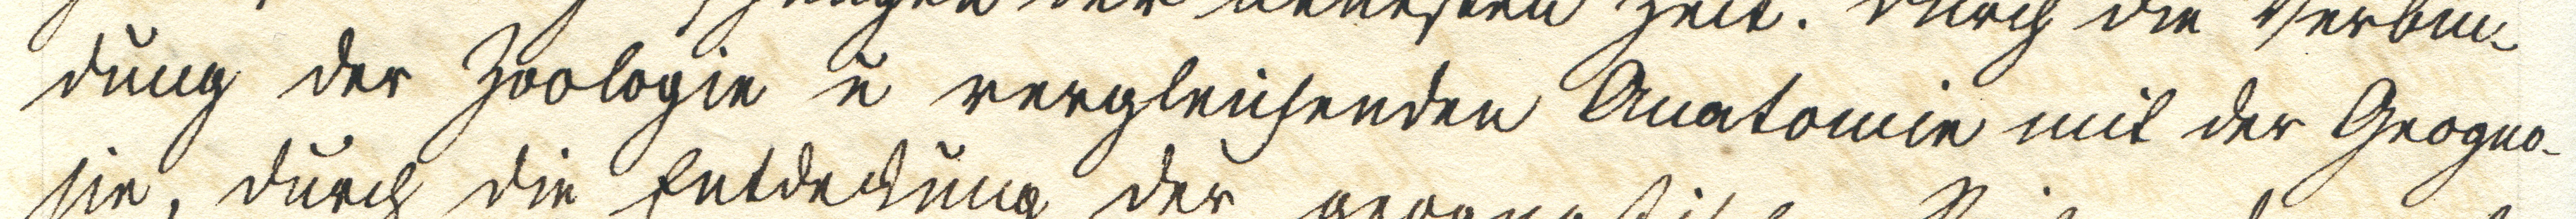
dung der Zoologie u vergleichenden Anatomie mit der Geogno-
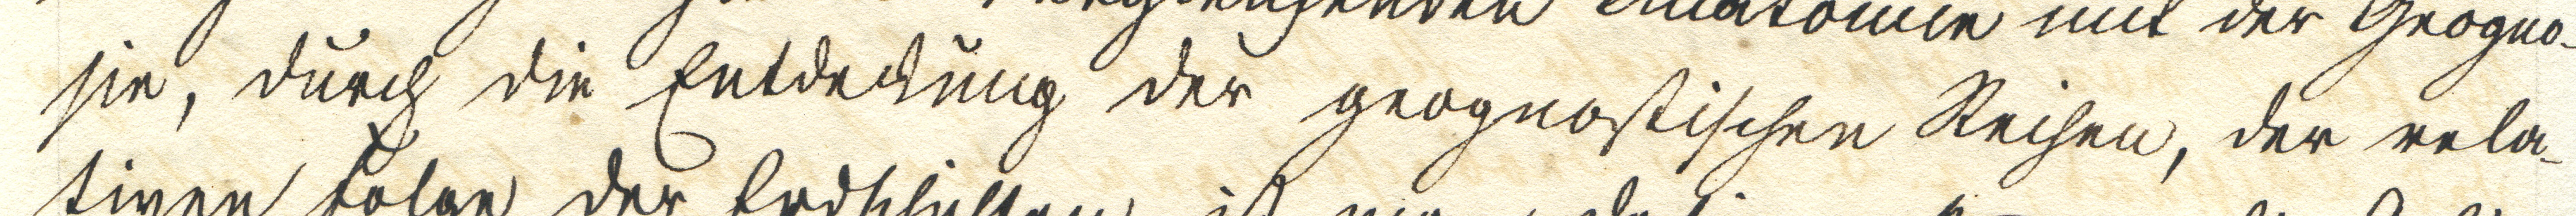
sie, durch die Entdeckung der geognostischen Reisen, der rela-
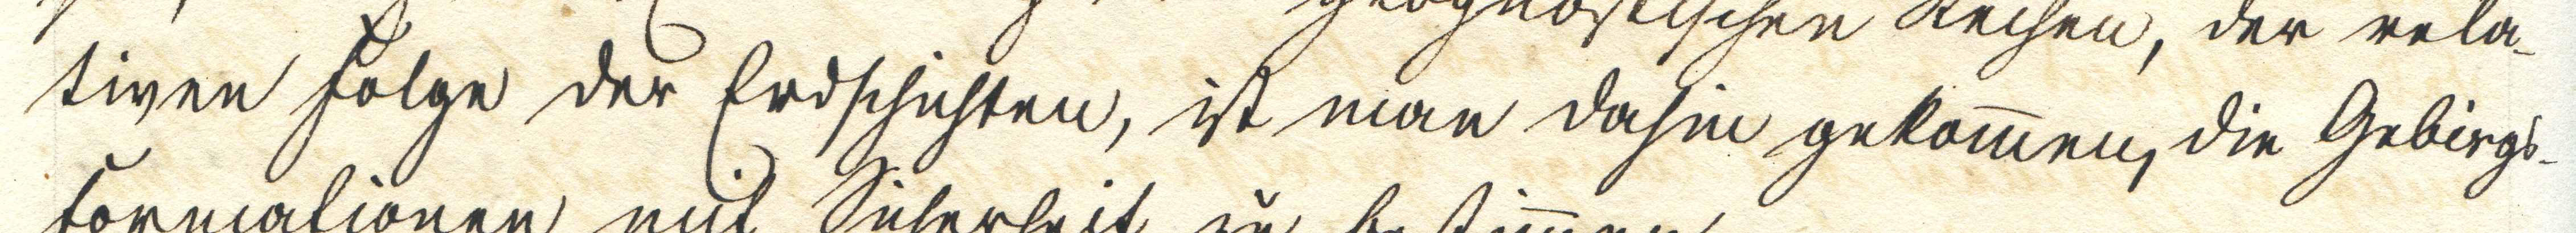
tiven Folge der Erdschichten, ist man dahin gekom̃en, die Gebirgs-
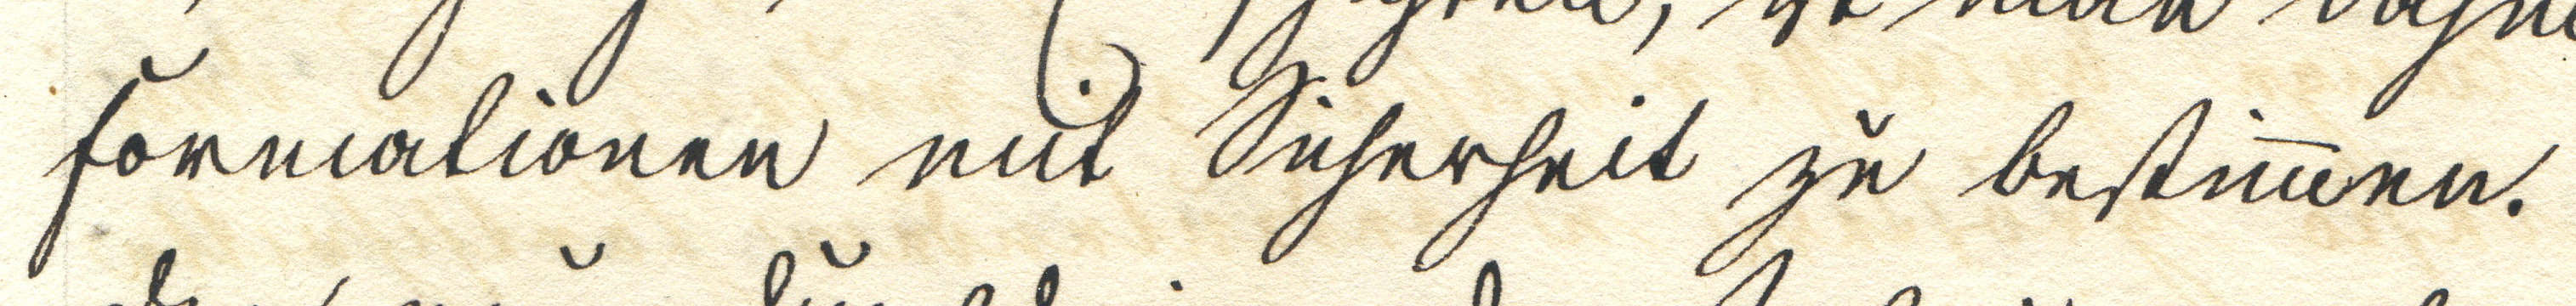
formationen mit Sicherheit zu bestim̃en.
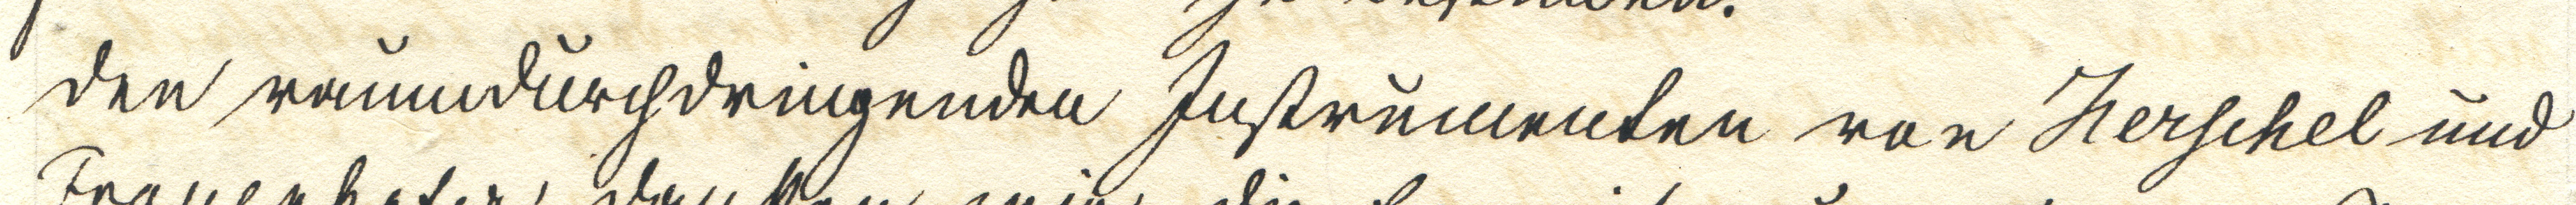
Den raumdurchdringenden Instrumenten von Herschel und
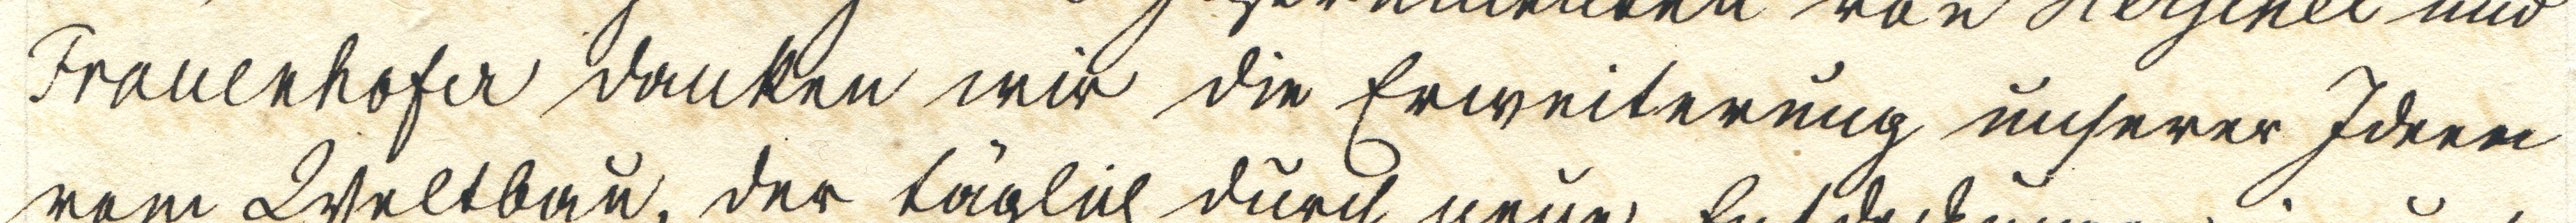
Frauenhofer danken wir die Erweiterung unserer Ideen
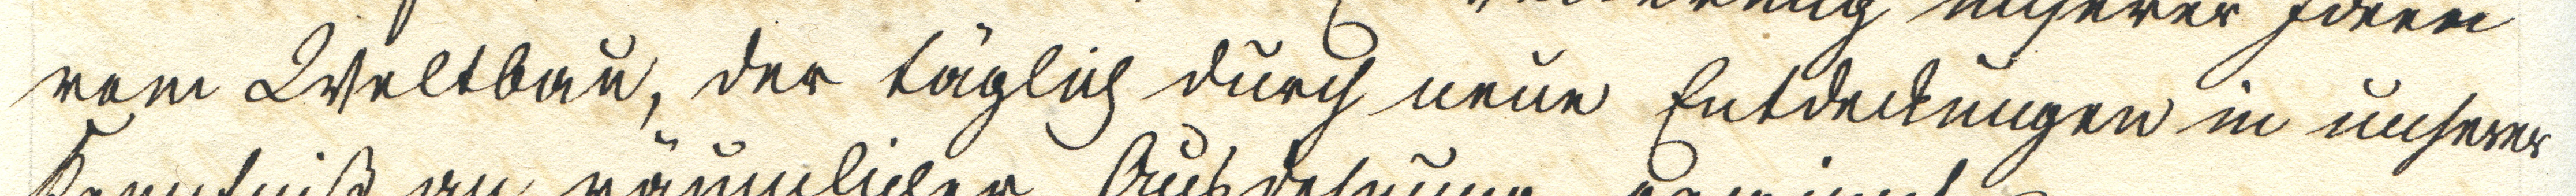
vom Weltbau, der täglich durch neue Entdeckungen in unserer
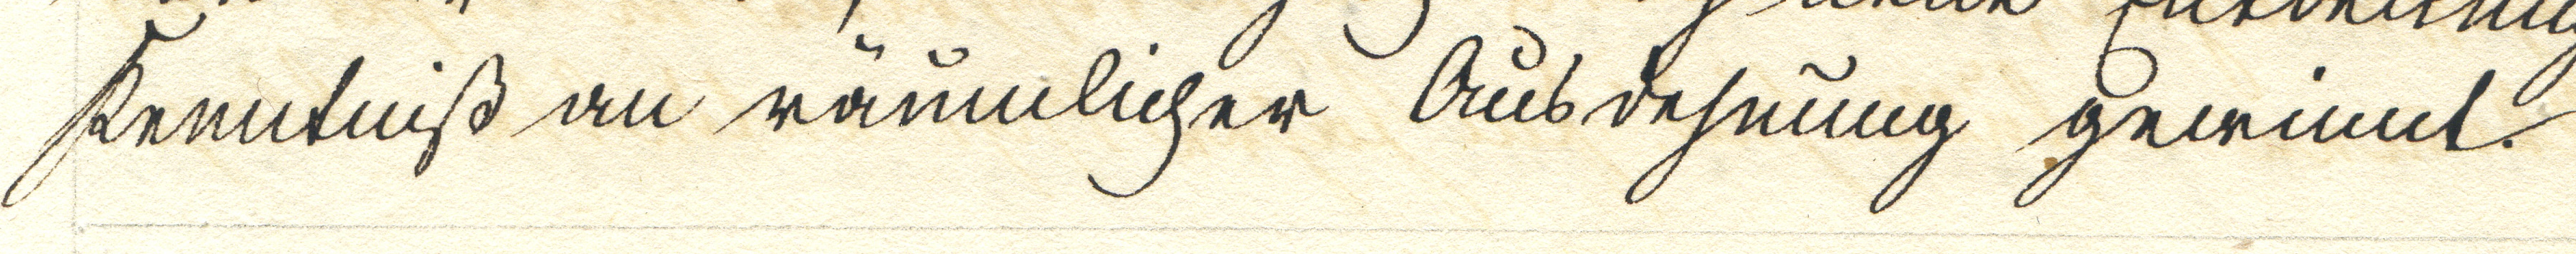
Kenntniß an räumlicher Ausdehnung gewinnt.
